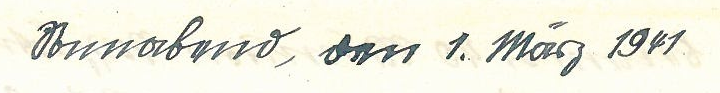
Sonnabend, den 1. März 1941
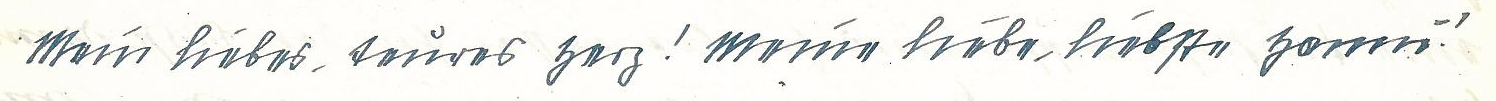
Mein liebes, teures Herz! Meine liebe, liebste !
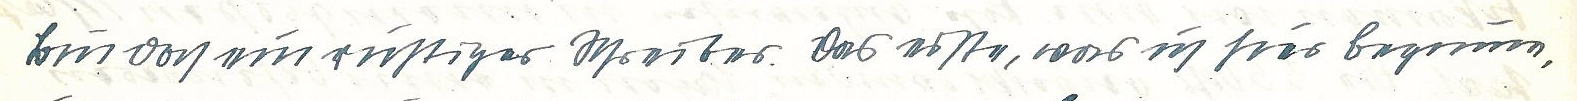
Bin doch ein richtiger Meister. Das erste, was ich hier beginne,
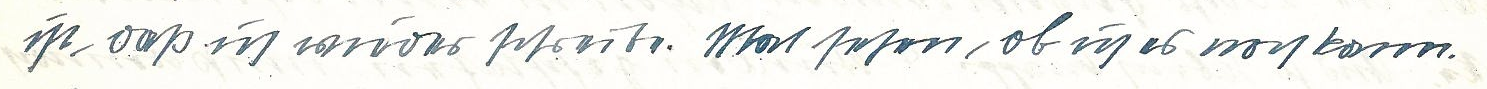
ist, daß ich wieder schreibe. Mal sehen, ob ich es noch kann.
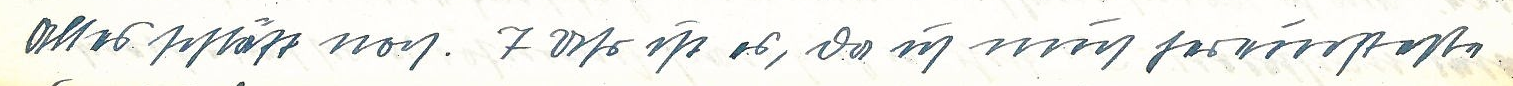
Alles schläft noch. 7 Uhr ist es, da ich mich hereinstehle
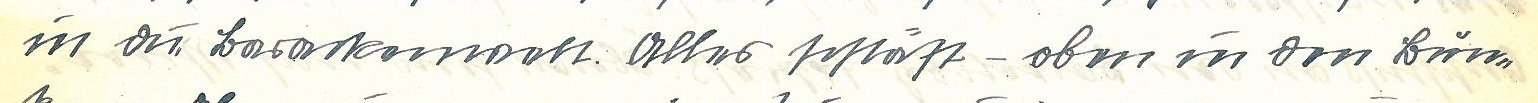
in die Barackenwelt. Alles schläft – oben in den Bun¬
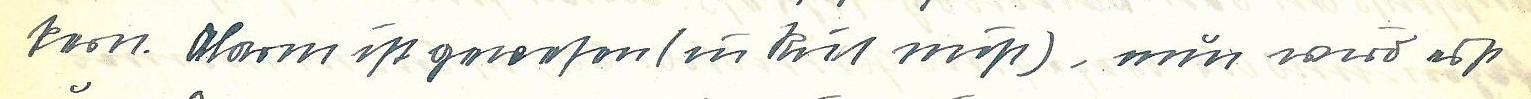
kern. Alarm ist gewesen (in Kiel nicht), nun wird erst
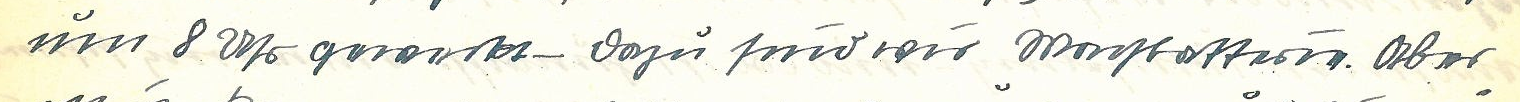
um 8 Uhr geweckt – dazu sind wir Wachbatterie. Aber
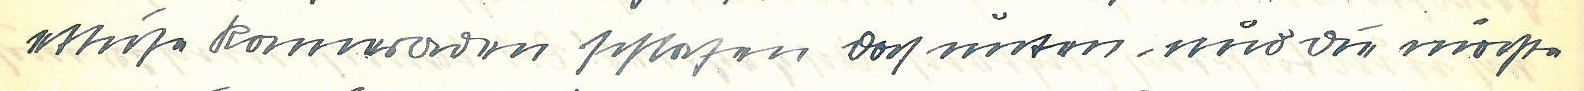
etliche Kameraden schlafen doch unten, und die möchte
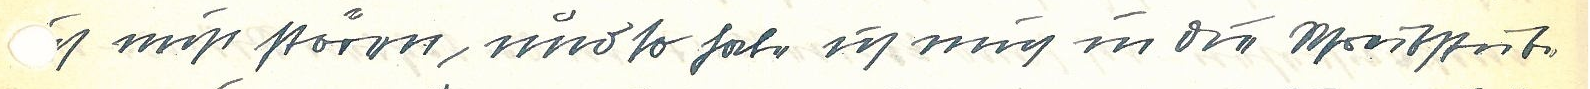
h nicht stören, und so habe ich mich in die Schreibstube
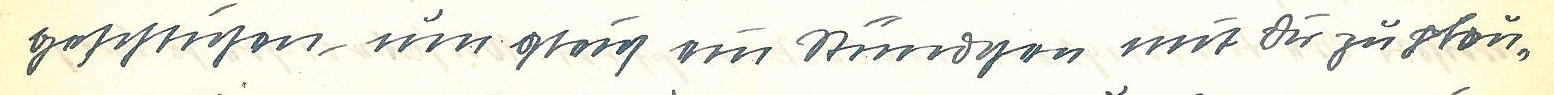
geschlichen, um gleich ein Stündchen mit Dir zu plau¬
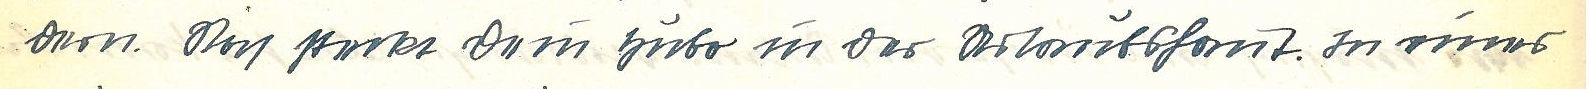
dern. Noch steckt Dein Hubo in der Urlaubshaut. In einer
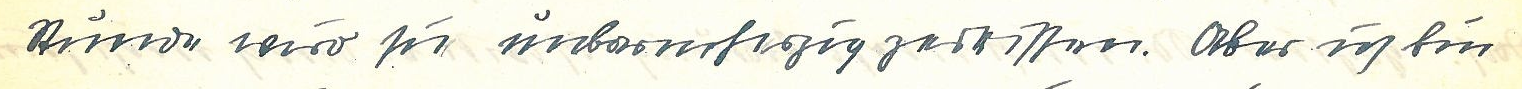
Stunde wird sie unbarmherzig zerrissen. Aber ich bin
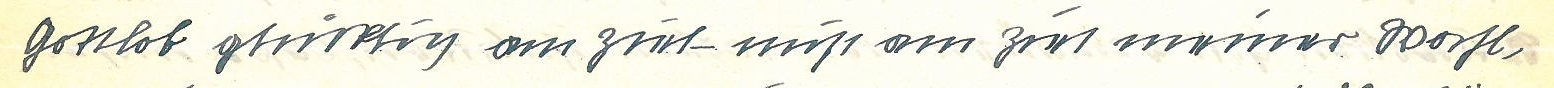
Gottlob glücklich am Ziel – nicht am Ziel meiner Wahl,
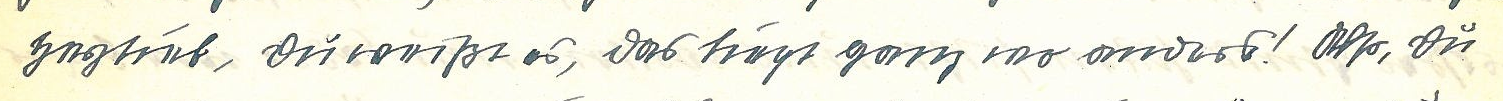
Herzlieb, Du weißt es, das liegt ganz wo anders! Also, Du
